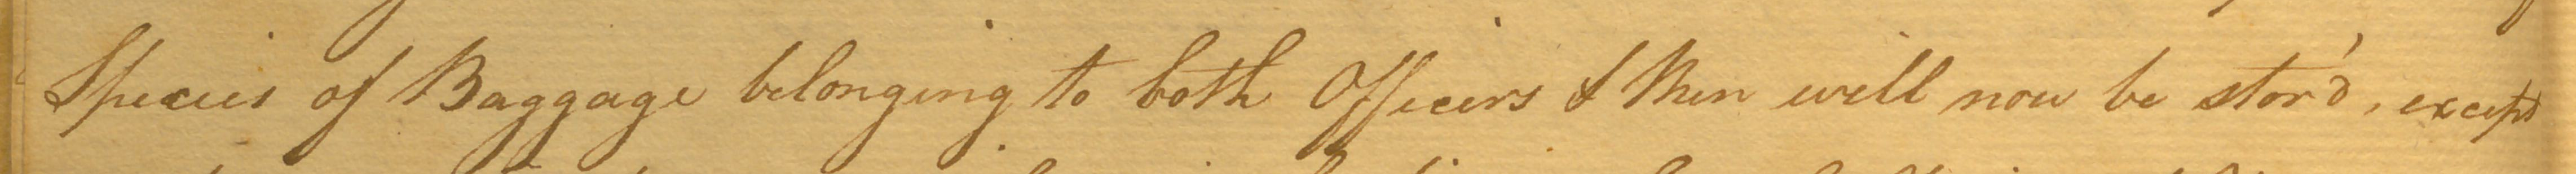Species of Baggage belonging to both Officers & Men will not be stor'd, except
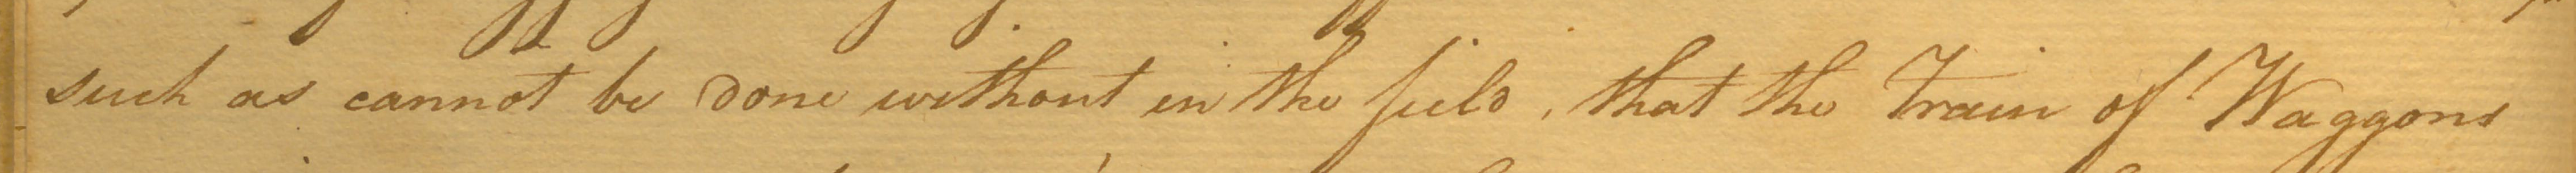such as cannot be done without in the field, that the Train of Waggons
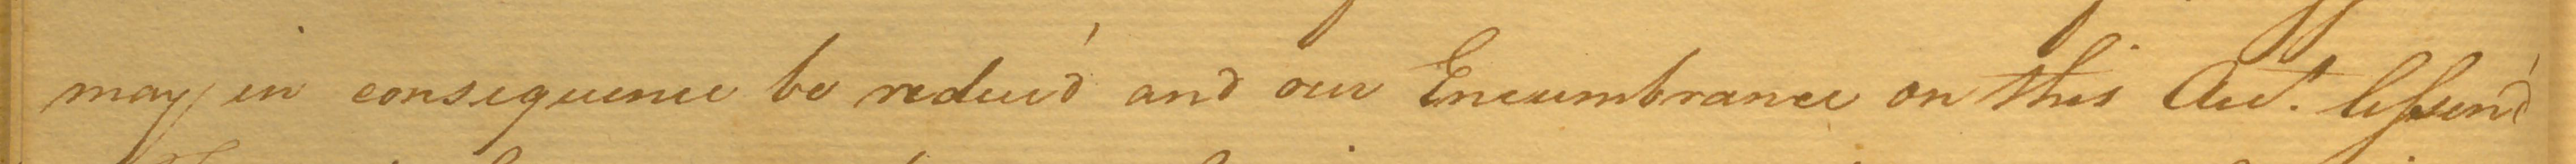may in consequence be reduc'd and our Encumbrance on this Acc^t. lessen'd
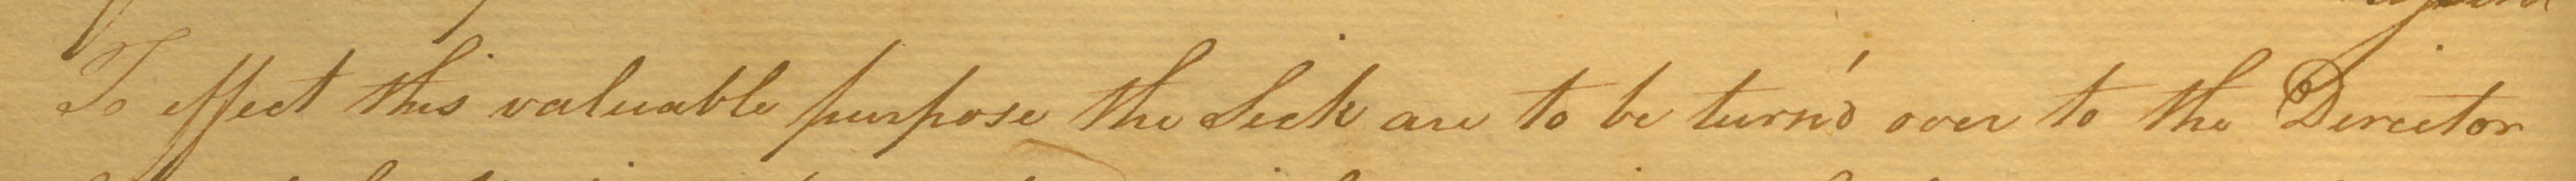To effect this valuable purpose the Sick are to be turn'd over to the Director
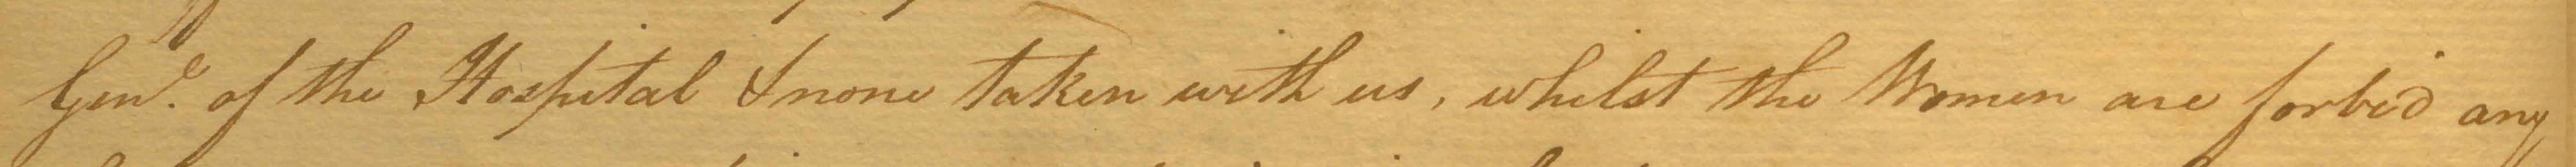Gen^l. of the Hospital & more taken with us, whilst the Women are forbid any
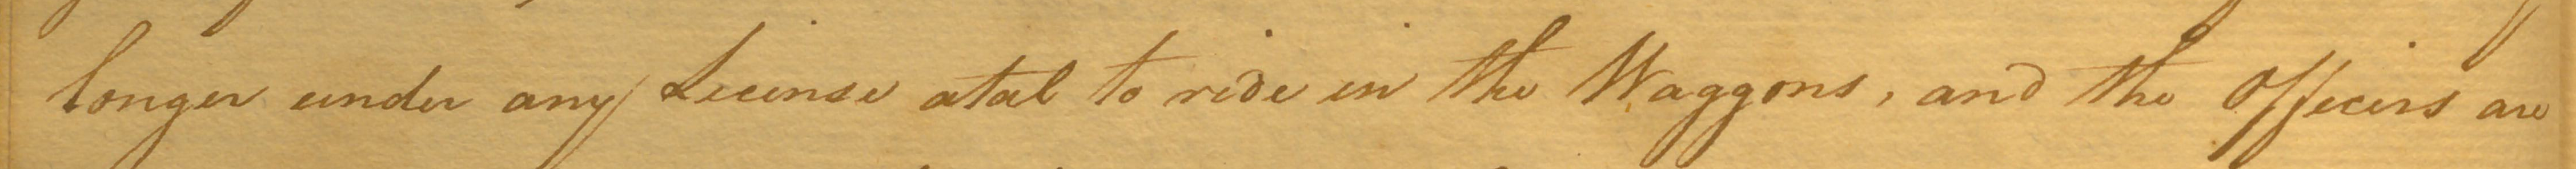longer under any License atal to ride in the Waggons, and the Officers are
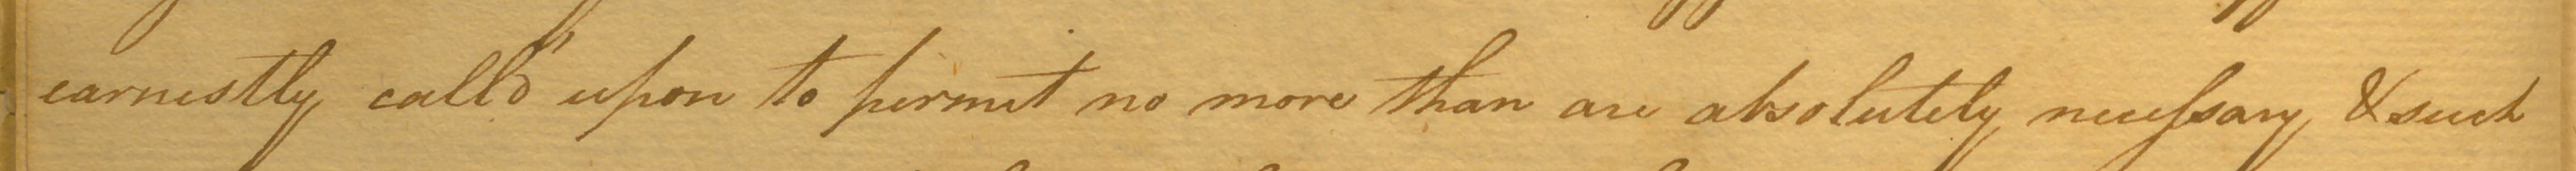earnestly call'd upon to permit no more than are absolutely necessary & such
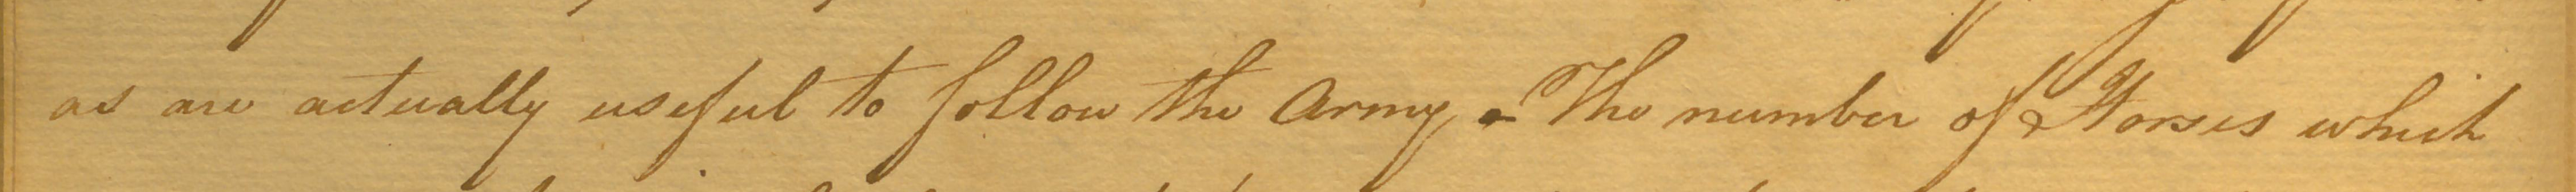as are actually useful to follow the Army. The Number of Horses which
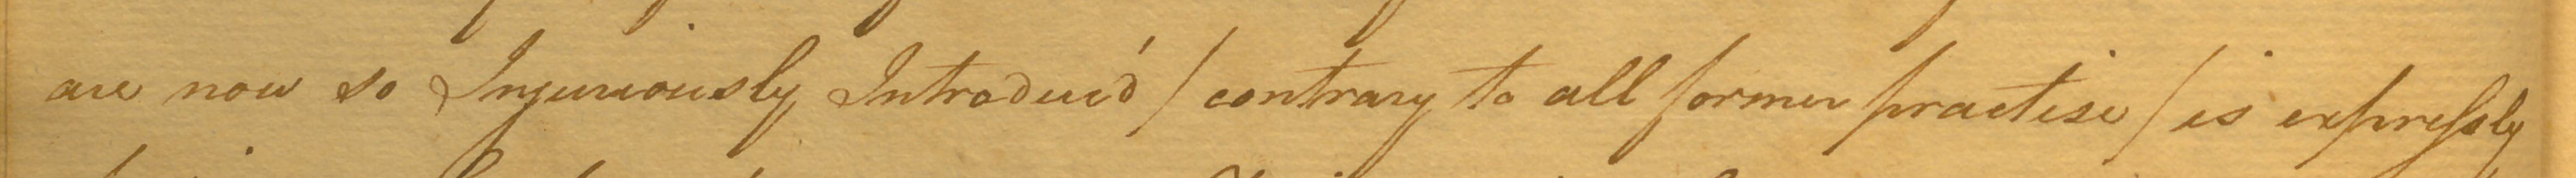are now so Injuriously Introduc'd /contrary to all former practise/ is expressly
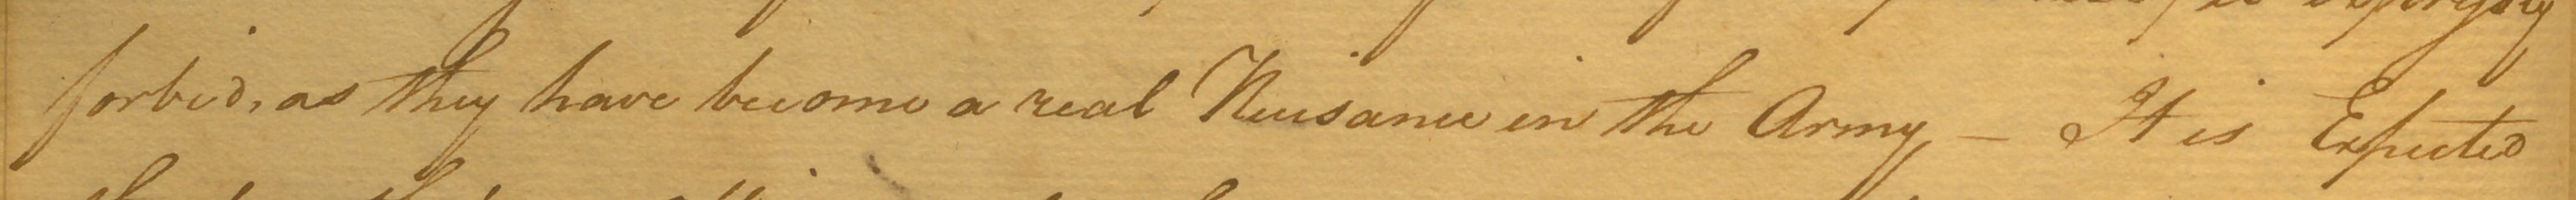forbid, as they have become a real Nuisance in the Army- It is Expected
